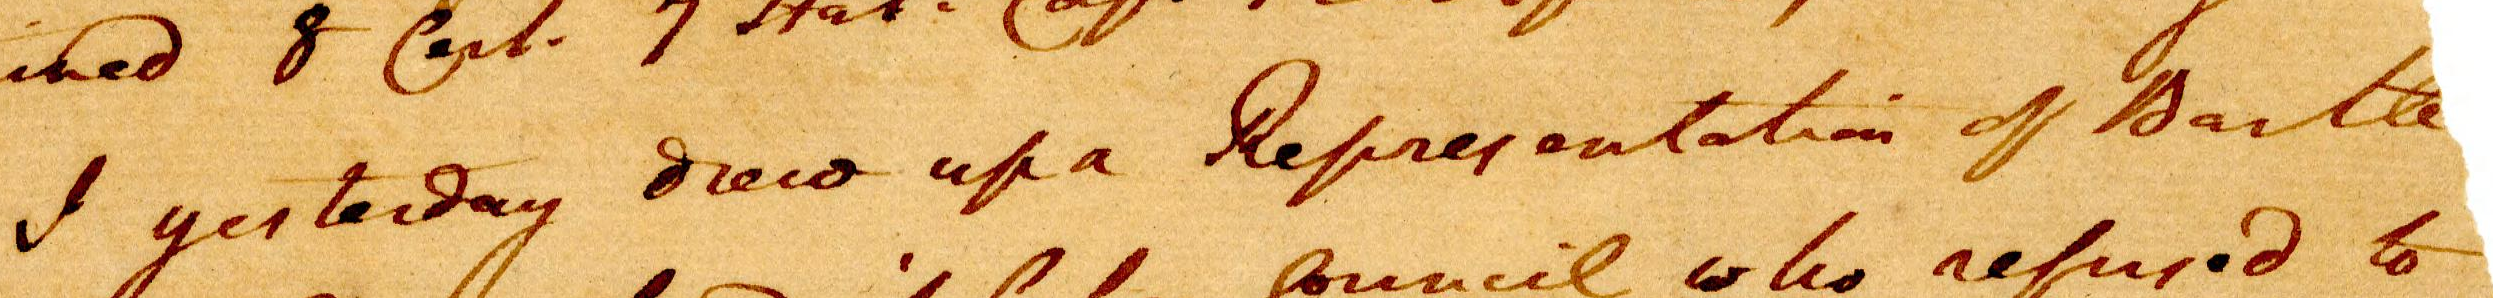I yesterday drew up a Representation of Battle
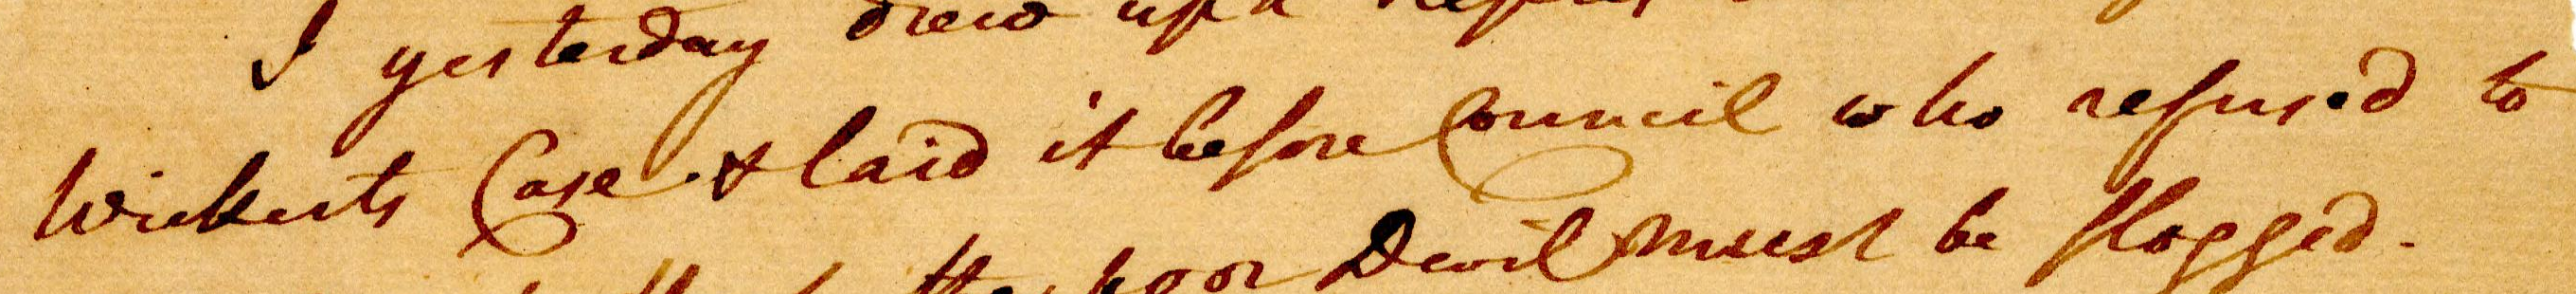Wickerts Cave & laid it before Council who refused to
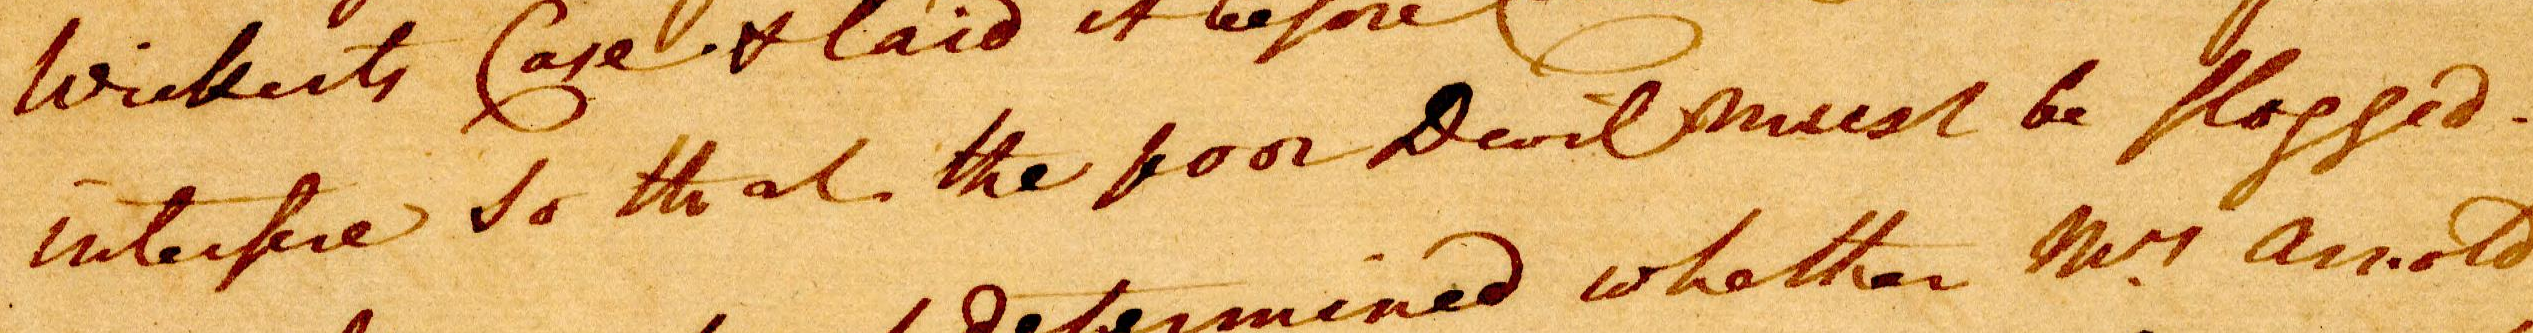interfere so that the poor Devil must be flogged.
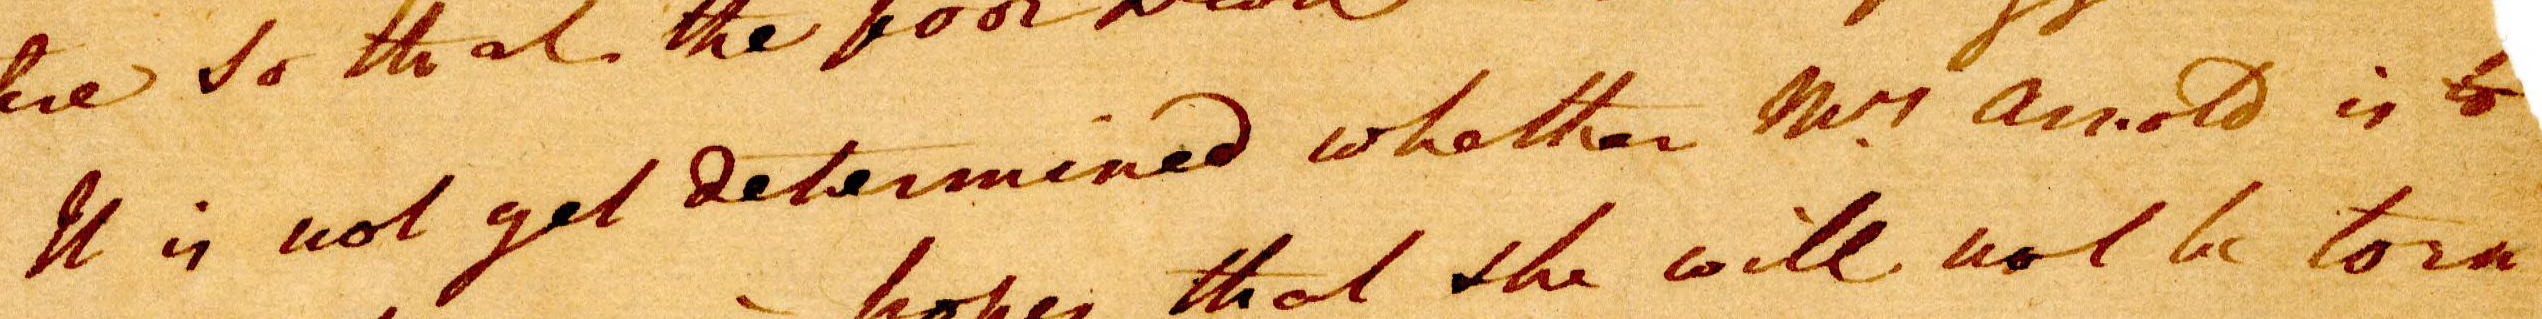It is not yet determined whether M^rs. Arnold is to
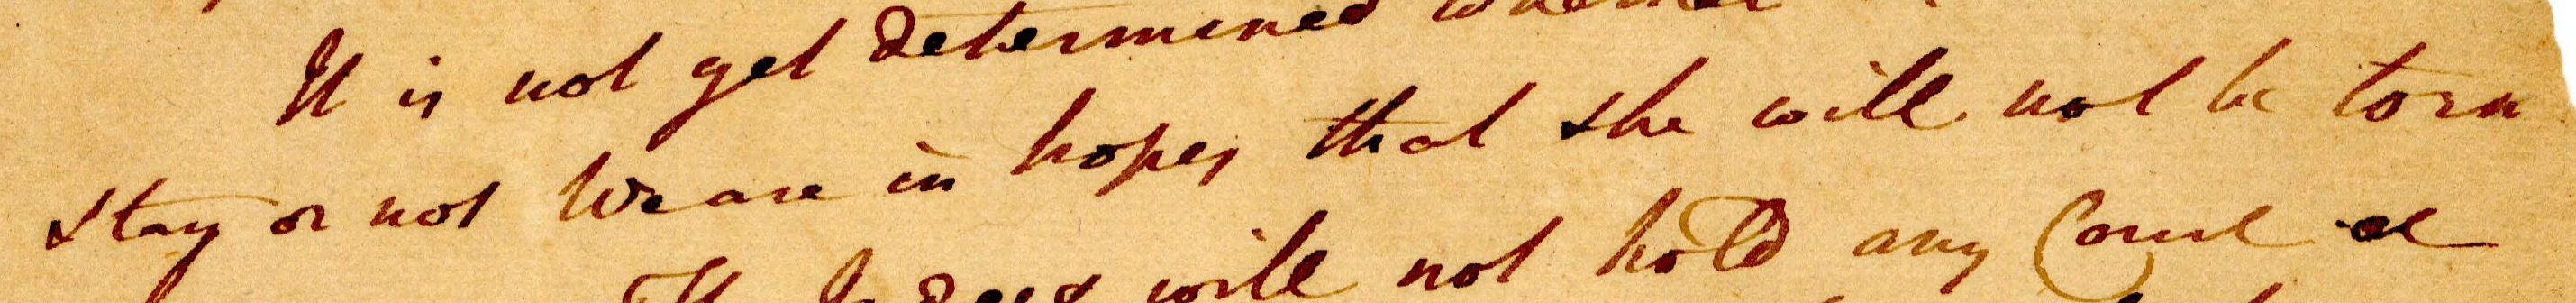stay or not We are in hopes that she will not be torn
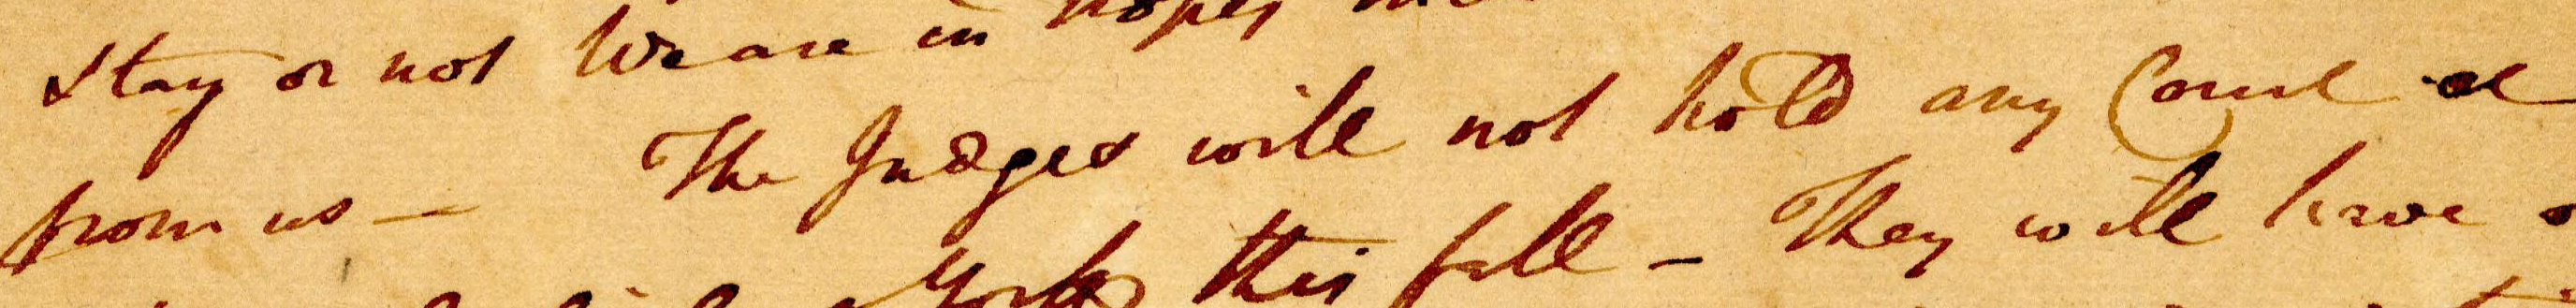from us. The Judges will not hold any Court at
